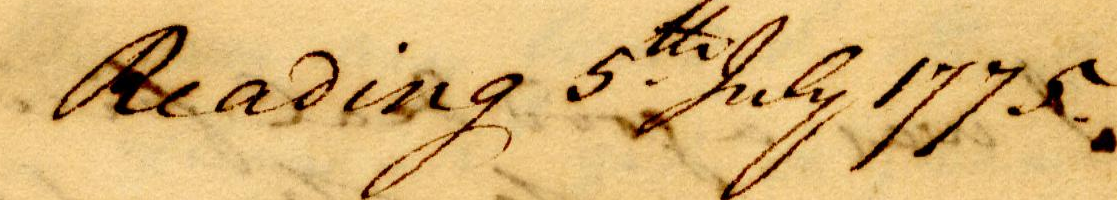Reading 5^th. July 1775.
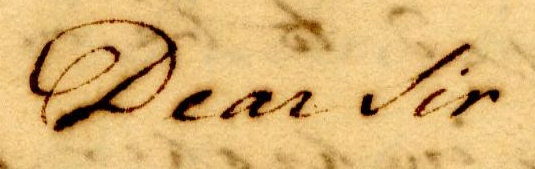Dear Sir
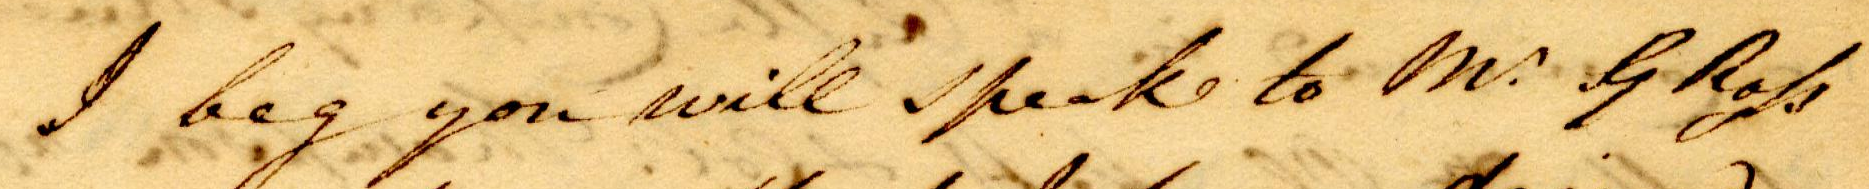I beg you will speak to M^r. G Ross
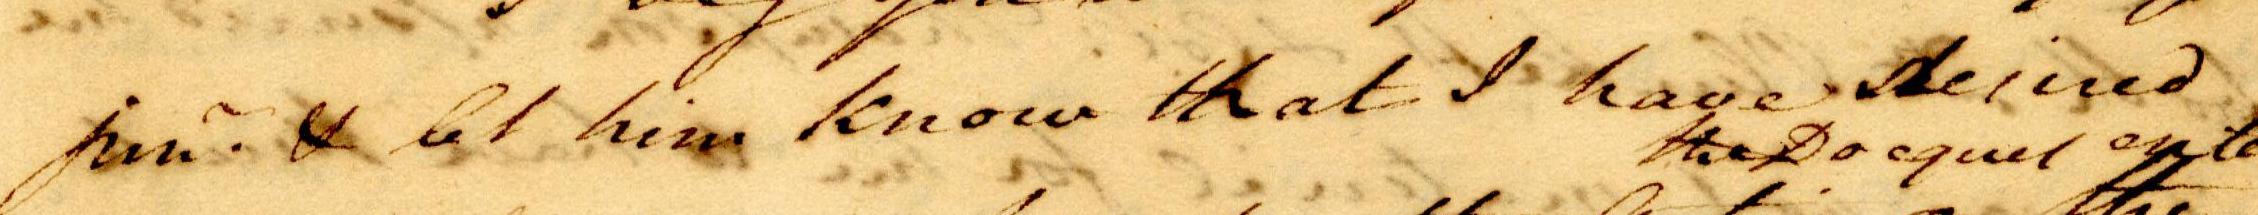sen^r. & let him know that I have desired
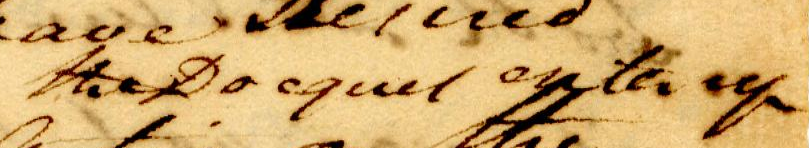the Docquet enter up
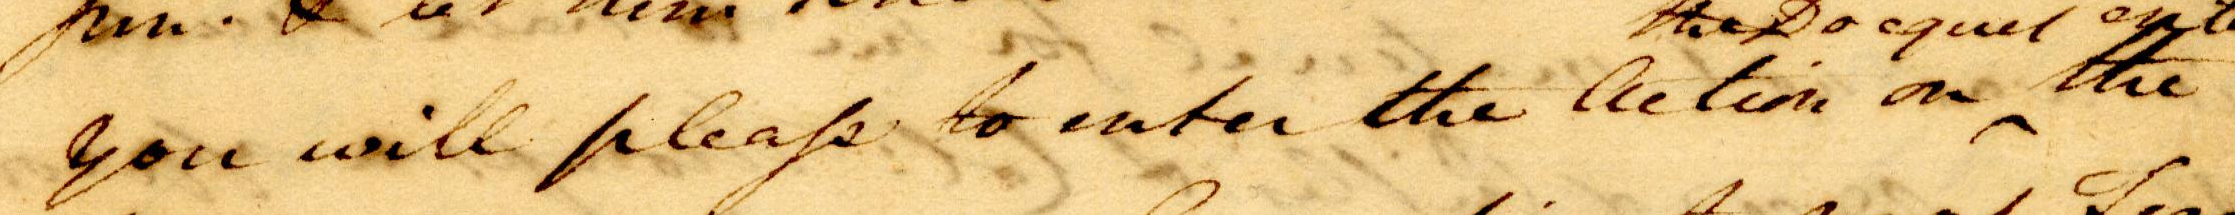you will please to enter the Action on ^ the
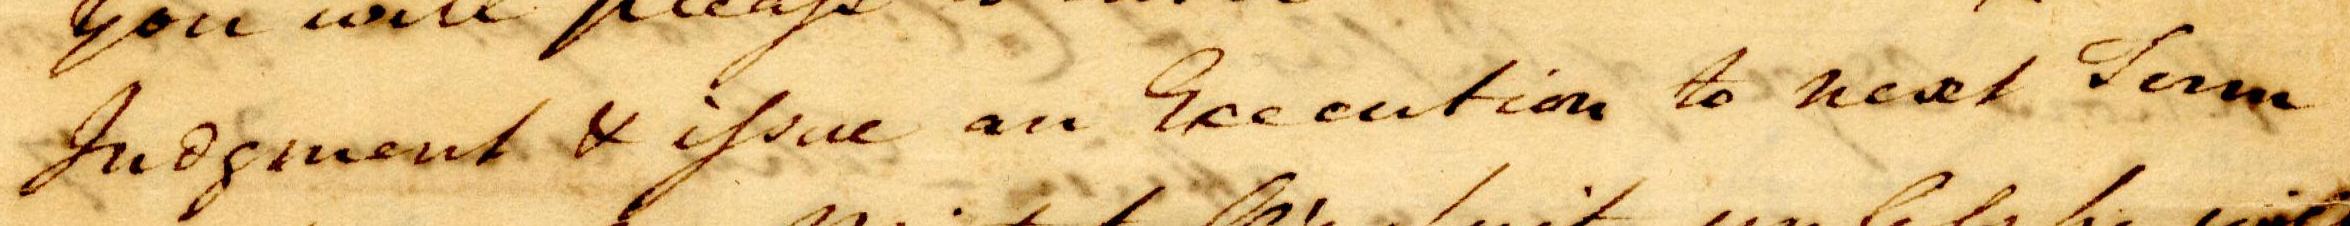Judgment & issue an Execution to next Term
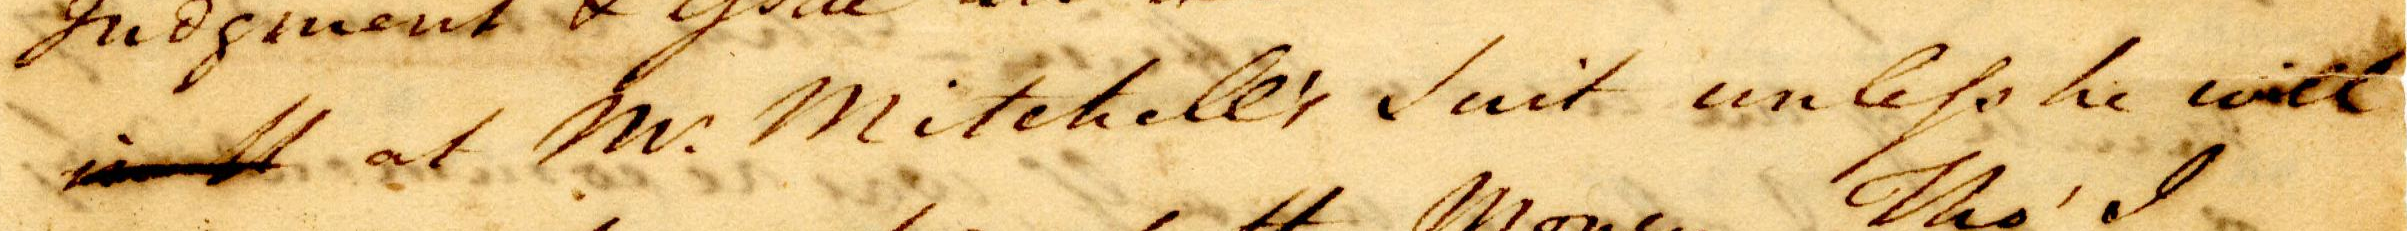is all at M^r. Mitchell's Suit unless he will
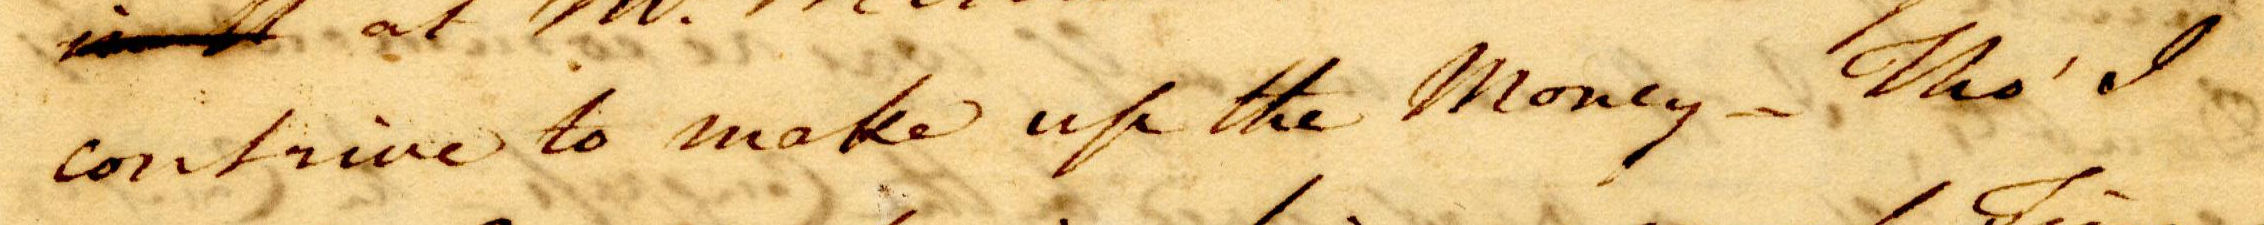contrive to make up the Money. Tho' I
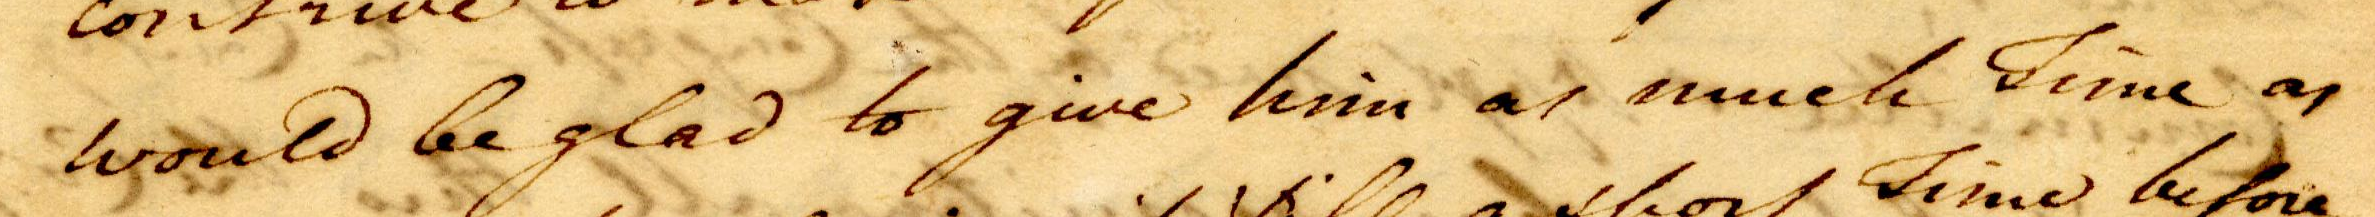would be glad to give him as much Time as
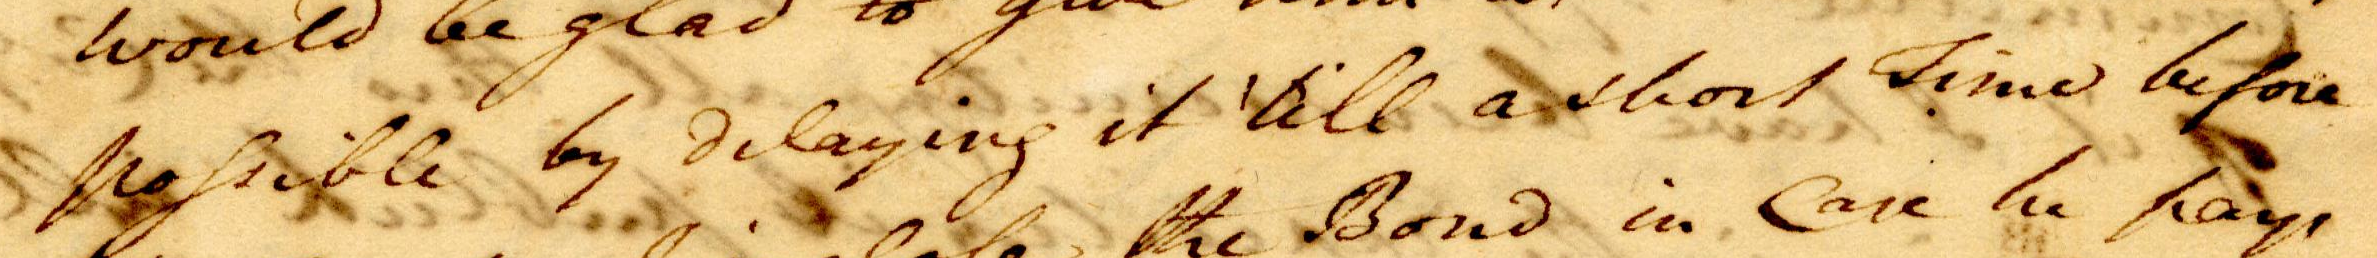possible by delaying it 'All a short Time before
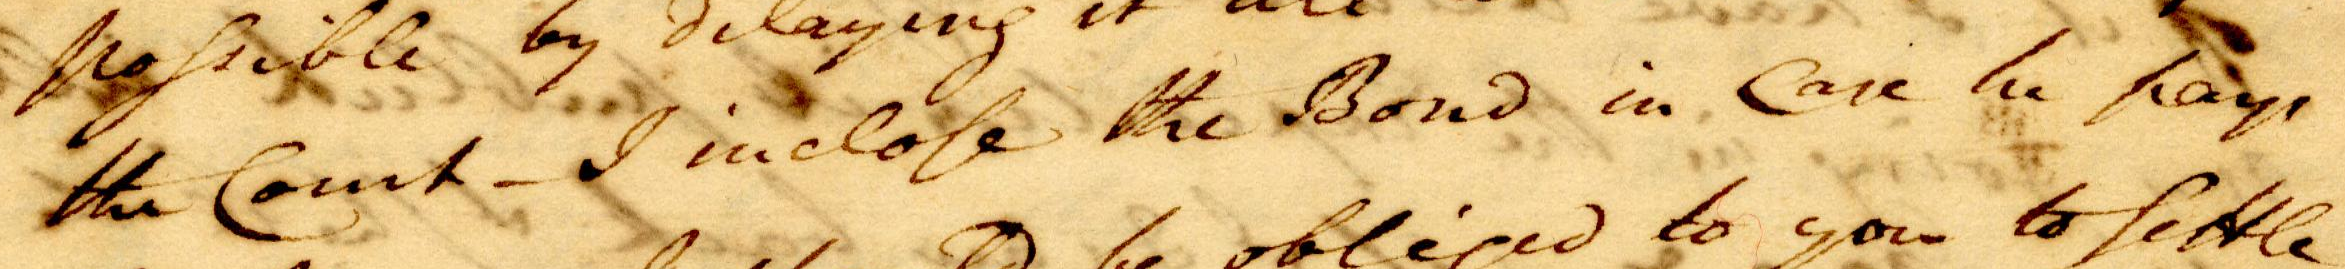the Court. I inclose the Bond in Case he pays
